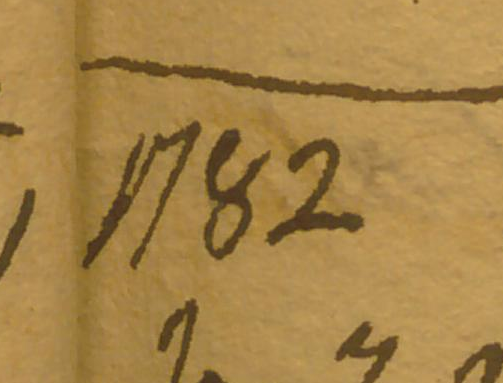1782
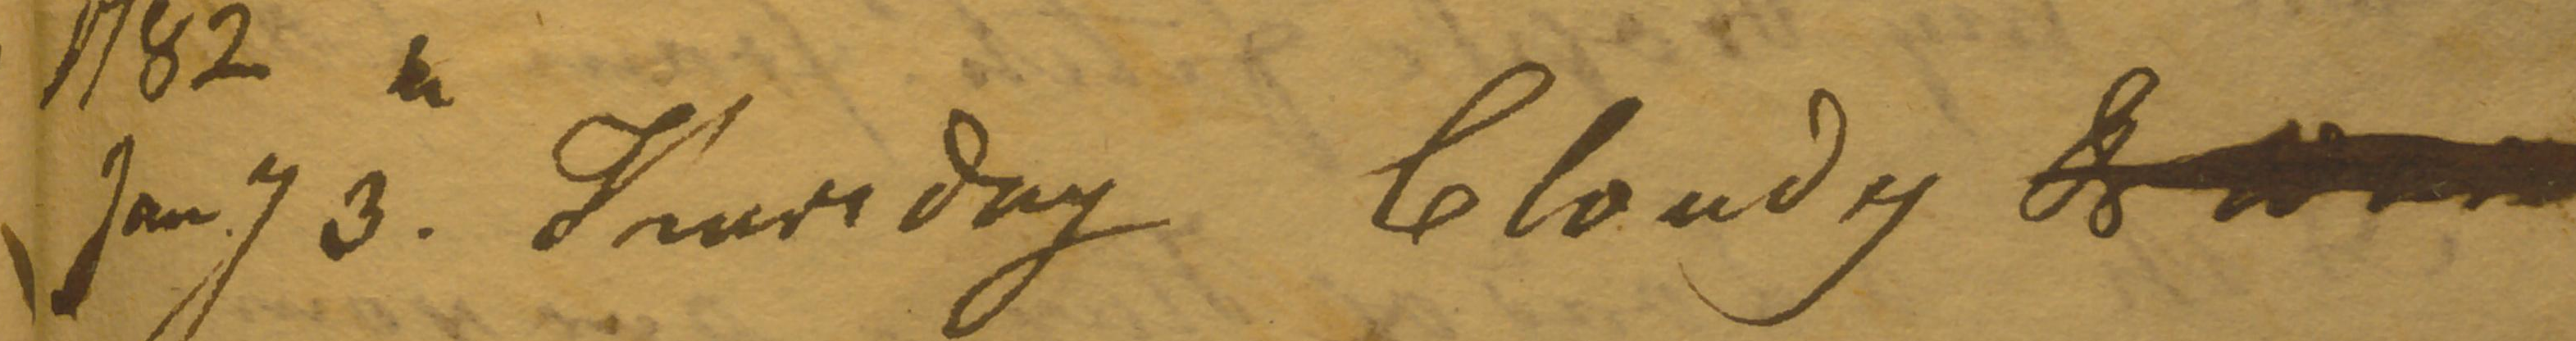Jan^y 3^th. Thursday Cloudy & [___]
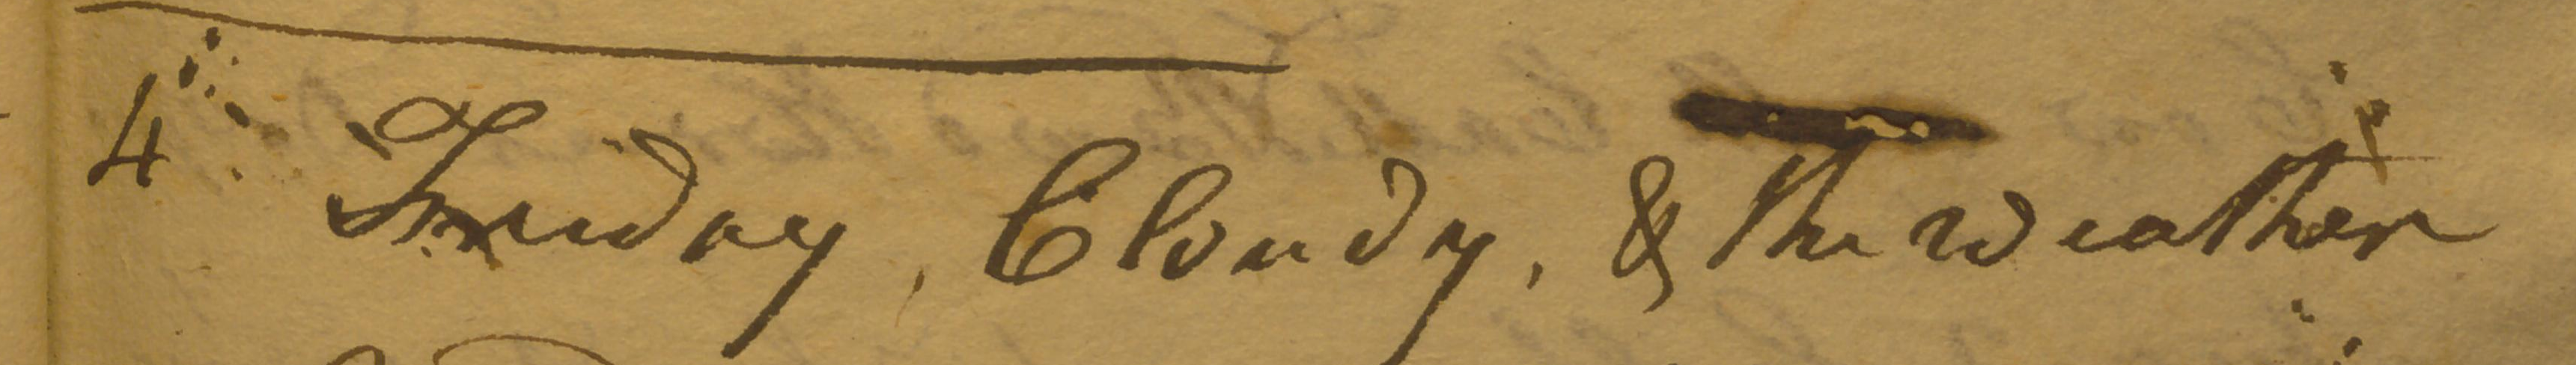4 Friday Cloudy, & the weather
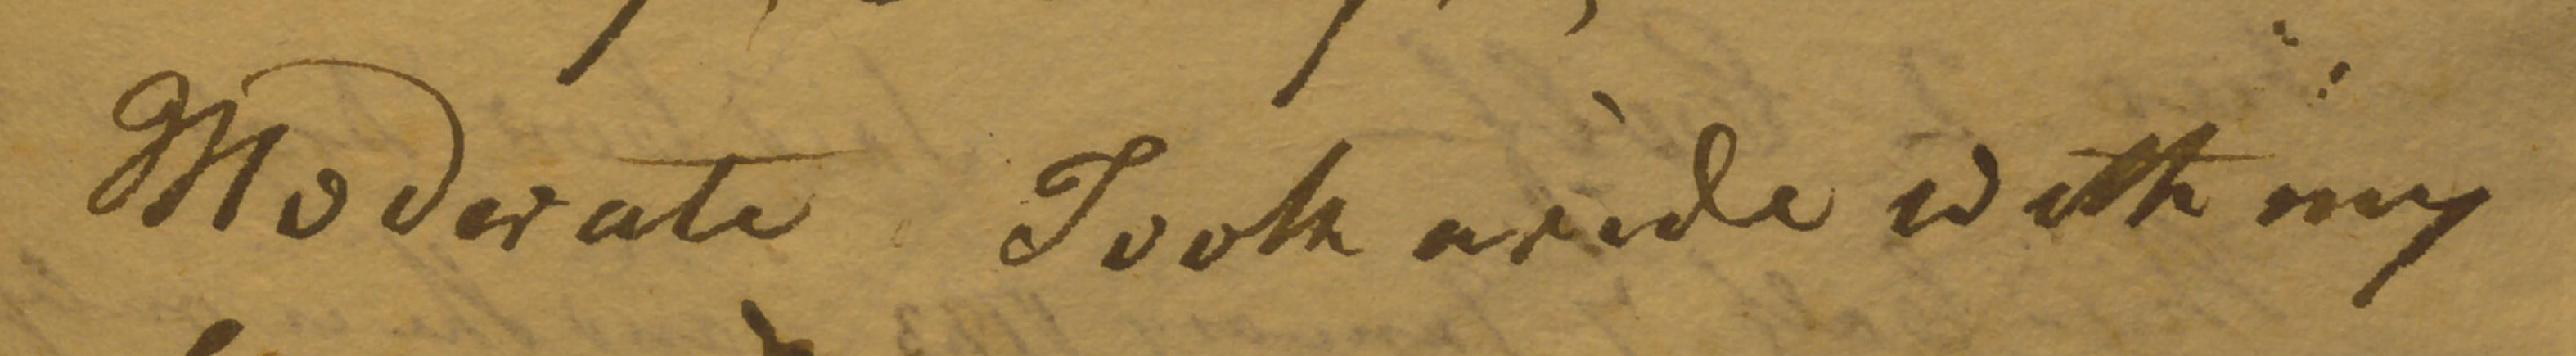Moderate Took a ride with my
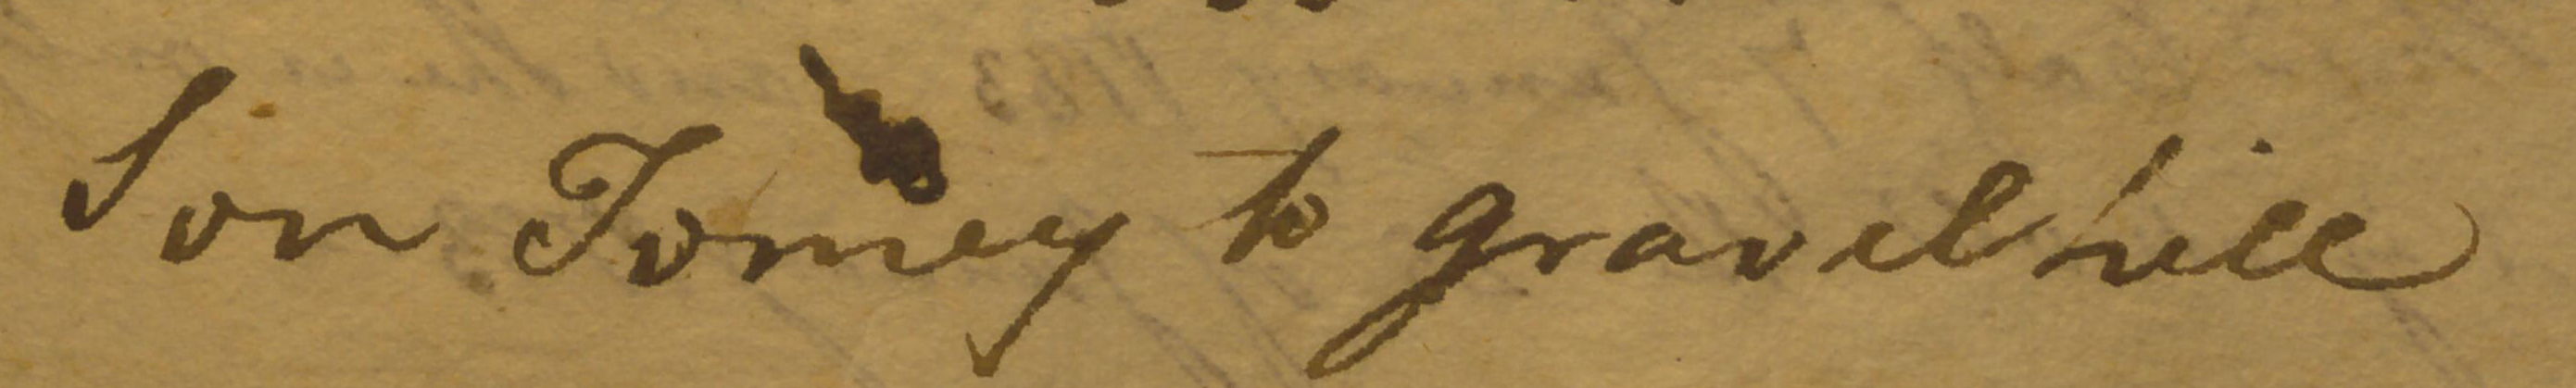Son Tomey to gravelhill
